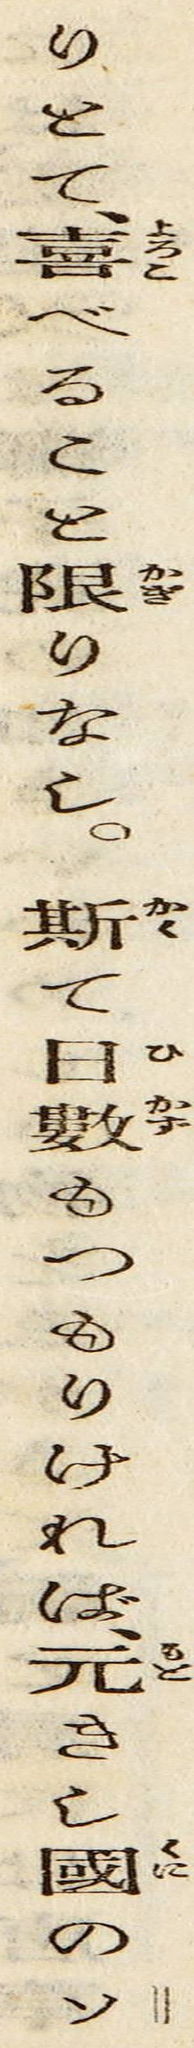りとて、喜べること限りなし。斯て日数もつもりければ、元きし国のソ
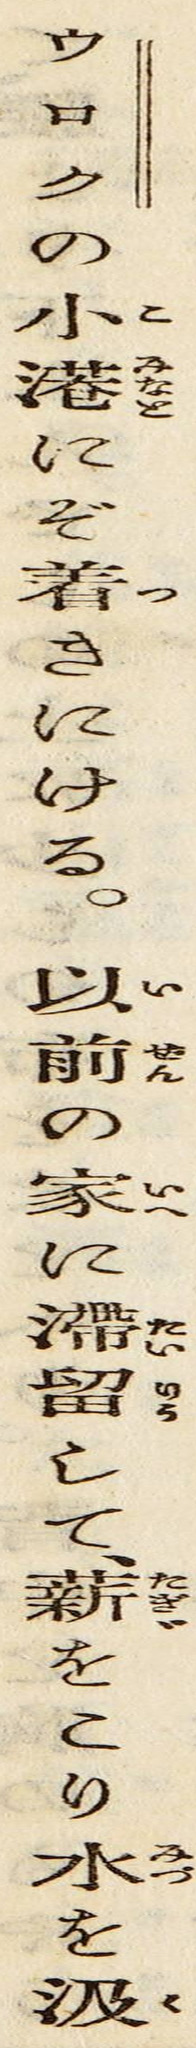ウロクの小港にぞ着きにける。以前の家に滞留して、薪をこり水を汲
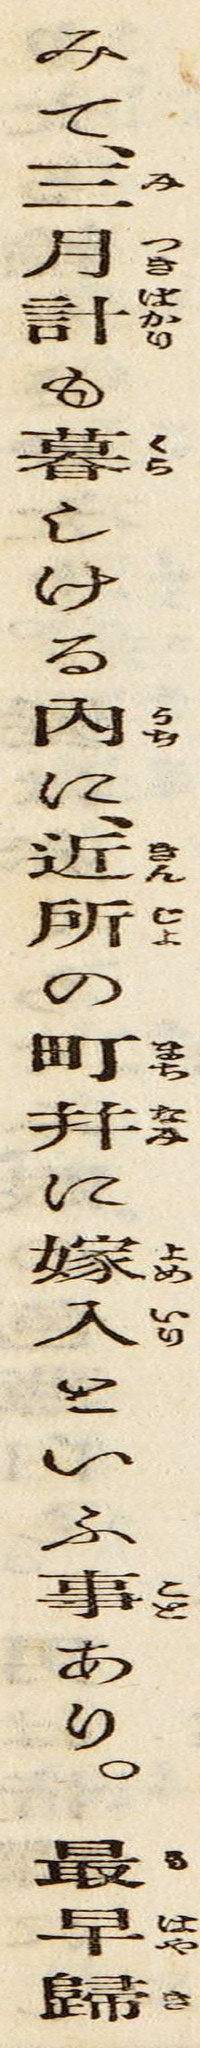みて、三月計も暮しける内に、近所の町并に嫁入といふ事あり。最早帰
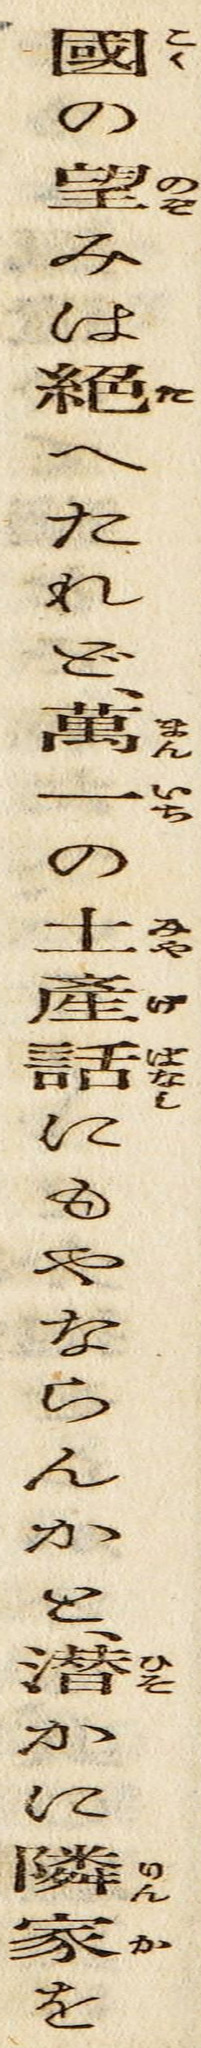国の望みは絶へたれど、万一の土産話にもやならんかと、潜かに隣家を
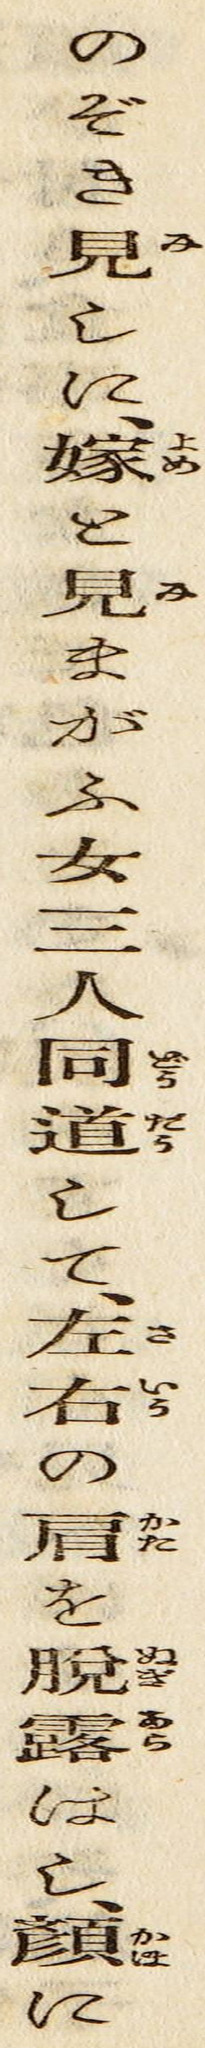のぞき見しに、嫁と見まがふ女三人同道して、左右の肩を脱露はし、顔に
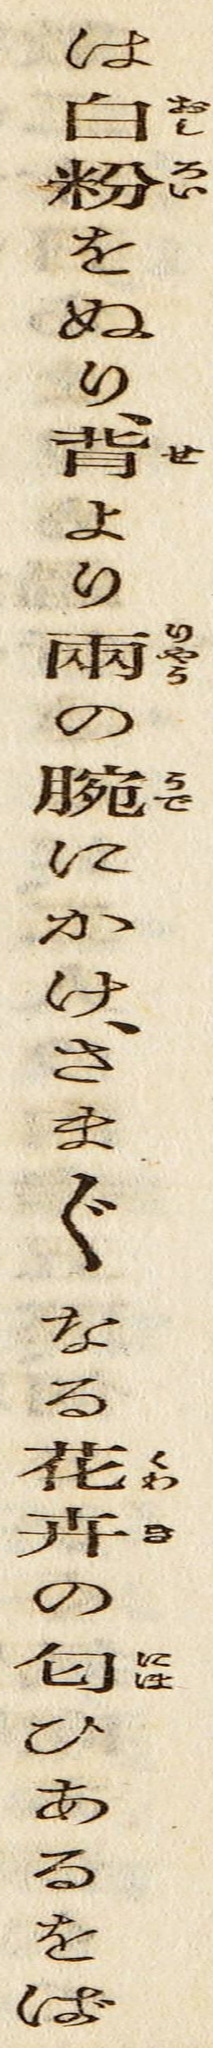は白粉をぬり、背より両の腕にかけ、さま〴〵なる花卉の匂ひあるをば
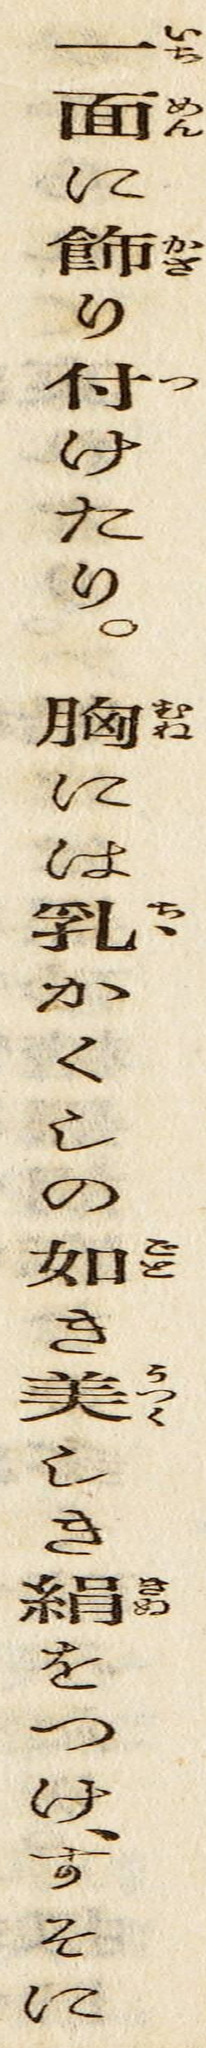一面に飾り付けたり。胸には乳かくしの如き美しき絹をつけ、すそに
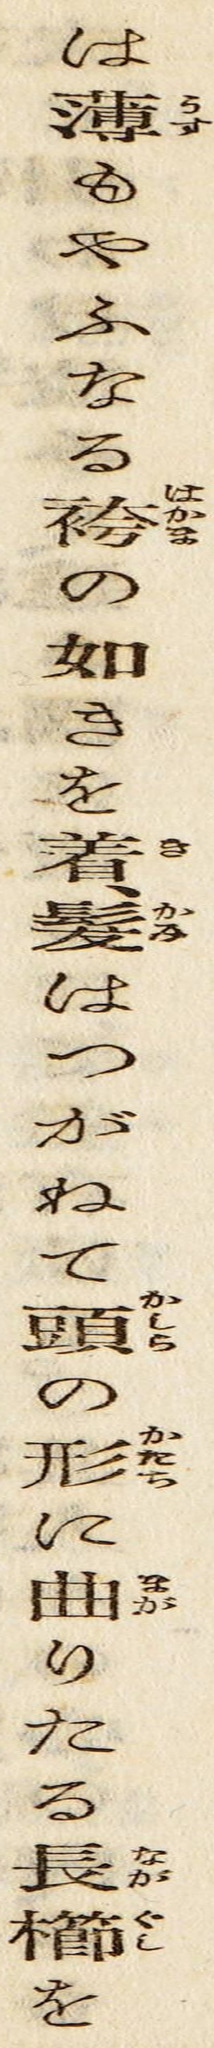は薄もやふなる袴の如きを着、髪はつがねて頭の形に曲りたる長櫛を
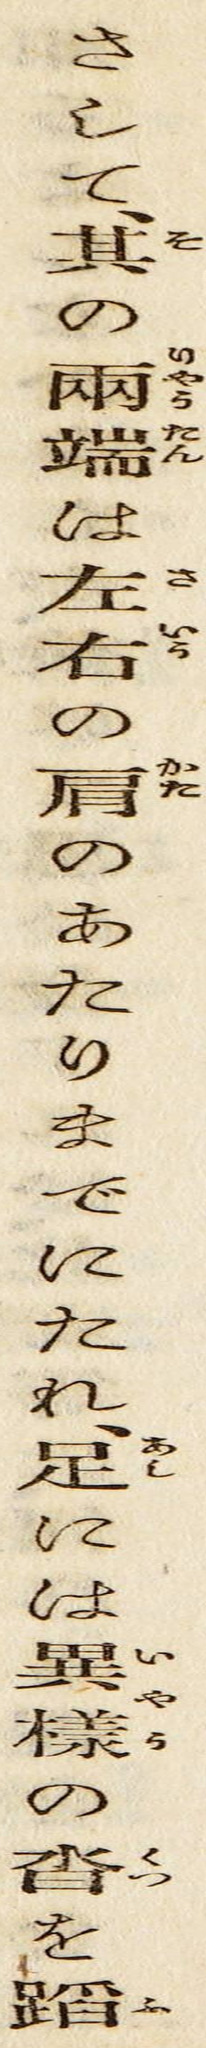さして、其の両端は左右の肩のあたりまでにたれ、足には異様の沓を蹈
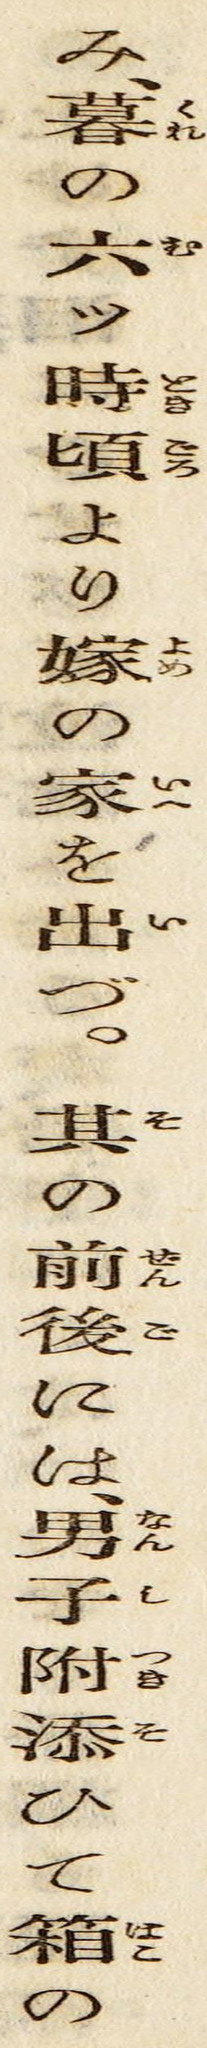み、暮の六ツ時頃より嫁の家を出づ。其の前後には、男子附添ひて箱の
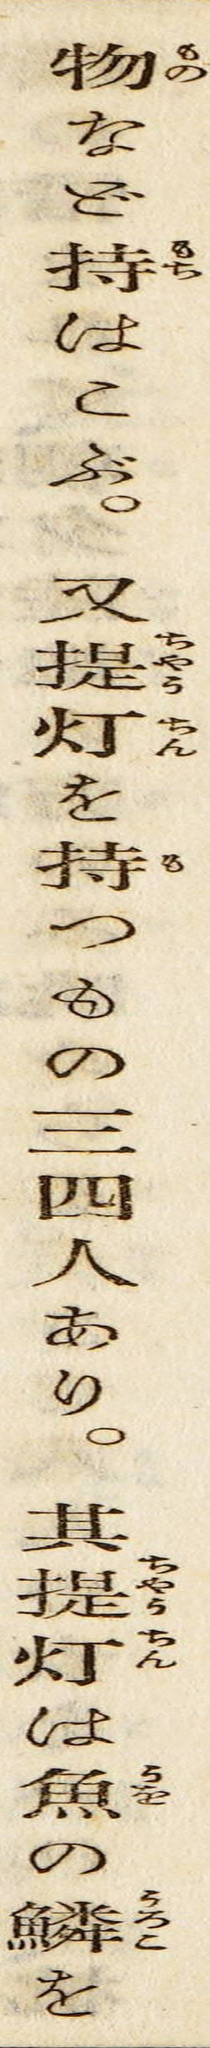物など持はこぶ。又提灯を持つもの三四人あり。其提灯は魚の鱗を
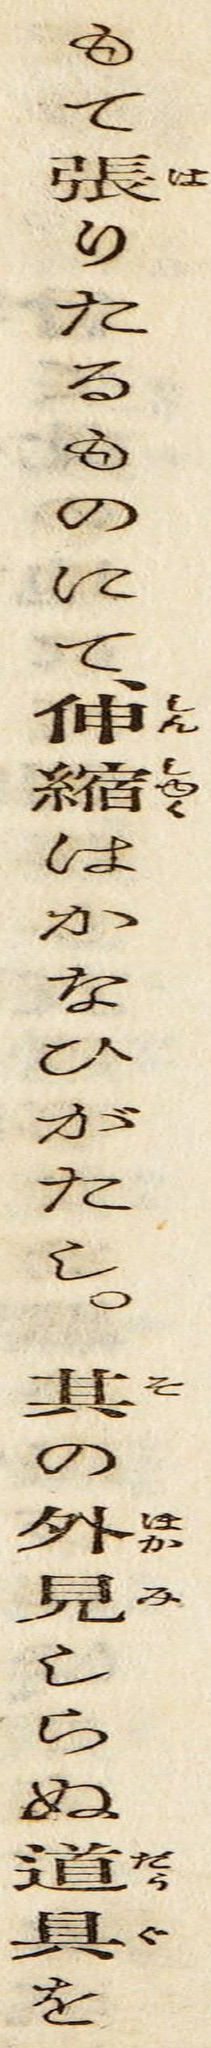もて張りたるものにて、伸縮はかなひがたし。其の外見しらぬ道具を
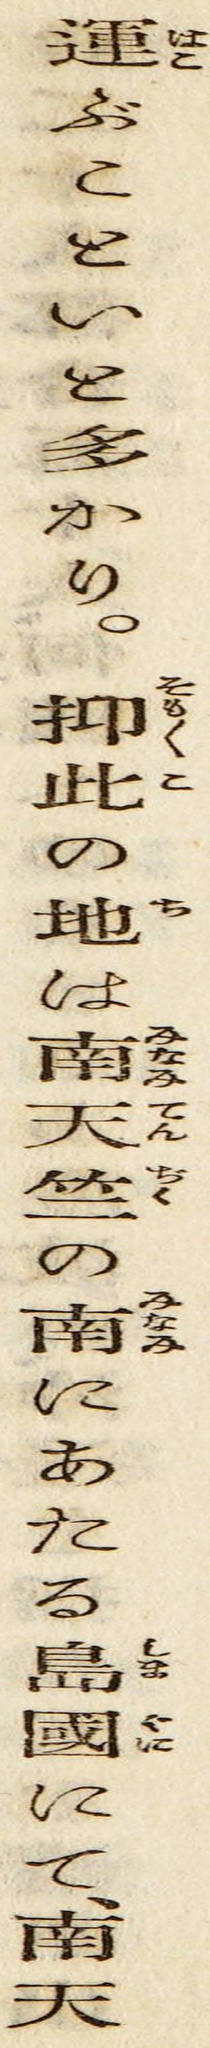運ぶこといと多かり。抑此の地は南天竺の南にあたる島国にて、南天
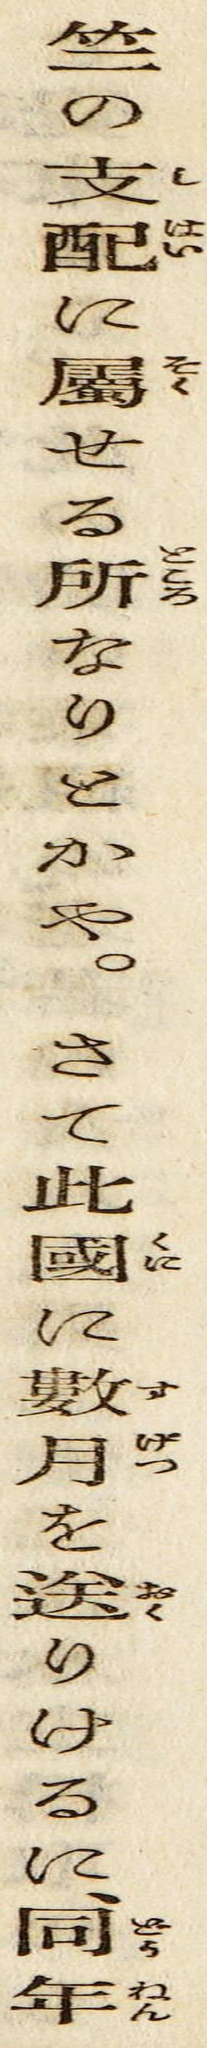竺の支配に属せる所なりとかや。さて此国に数月を送りけるに、同年
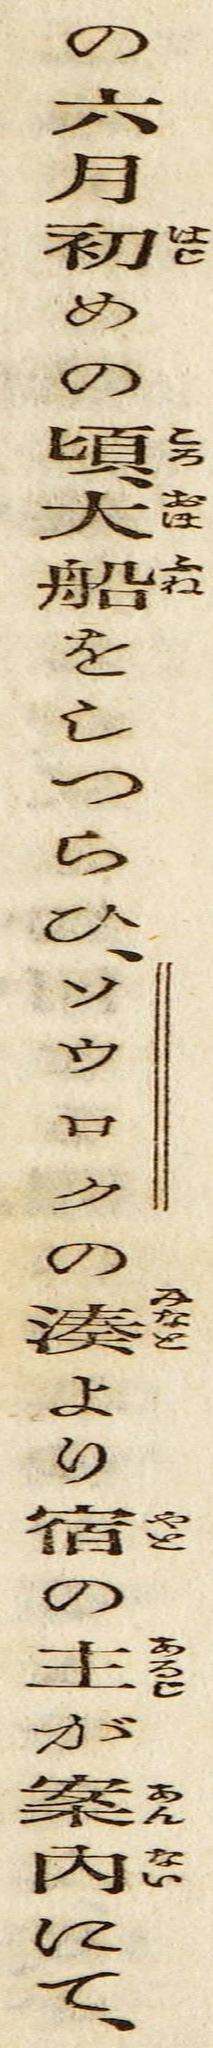の六月初めの頃、大船をしつらひ、ソウロクの湊より宿の主が案内にて、

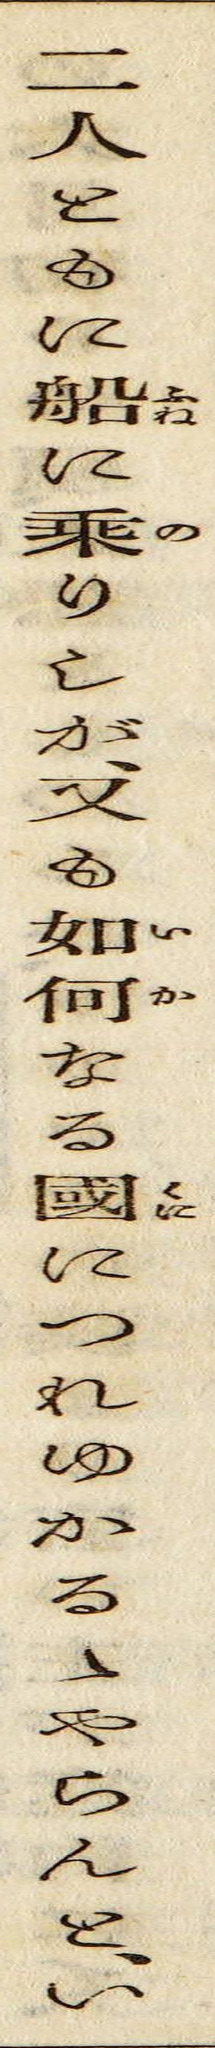二人ともに船に乗りしが、又も如何なる国につれゆかるゝやらんと、い
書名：日本漂流譚
